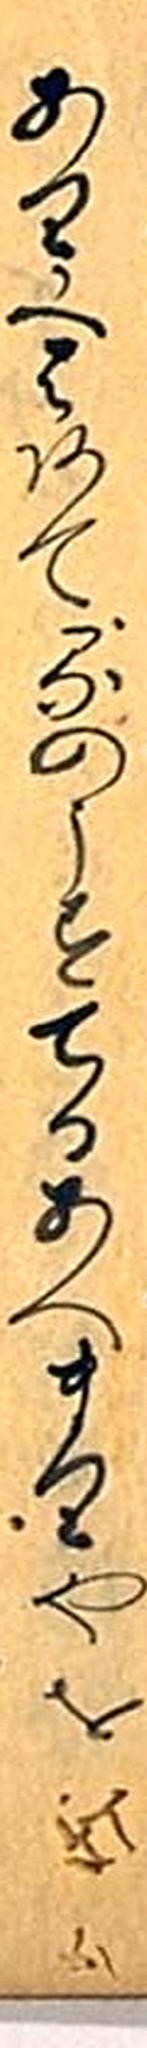あり又はあてるのうすてるあへまりやを
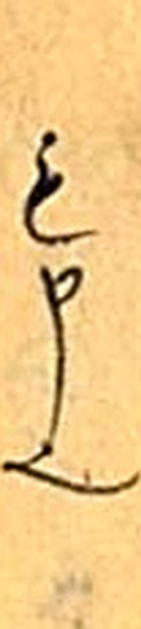も申也
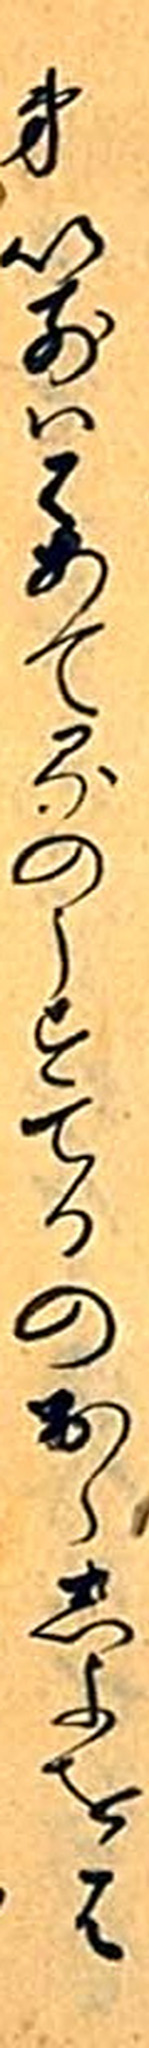弟以前ははあてるのうすてるのおらしよをは
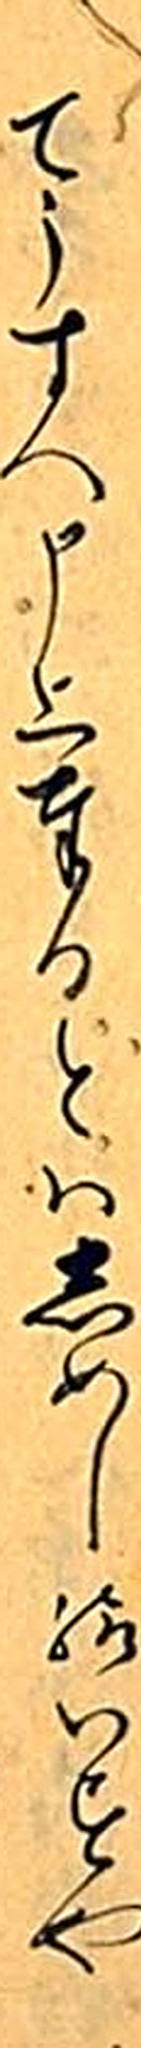てうすへ申上奉るとはしめし給はすや
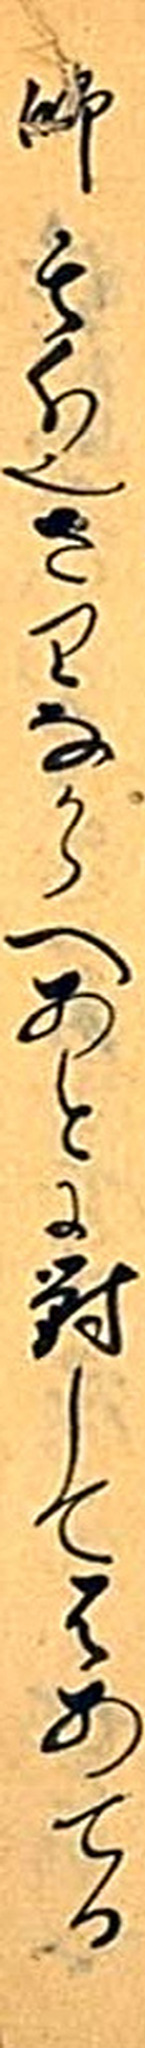師其分也さりなからへあとに対してはあてる
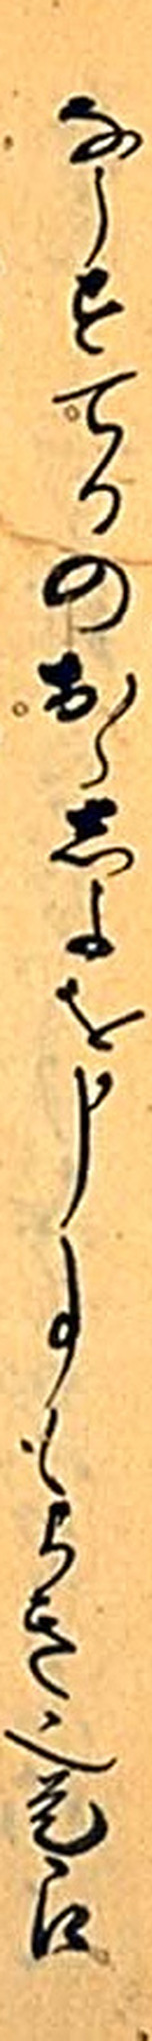なうすてるのおらしよを申事もよき也是即
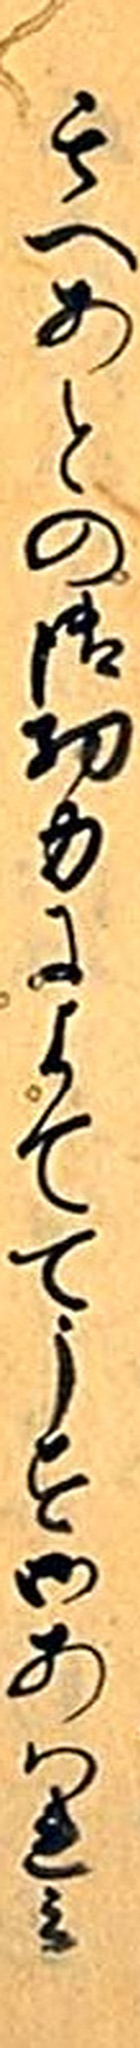其へあとの御功力によててうす御あはれみ
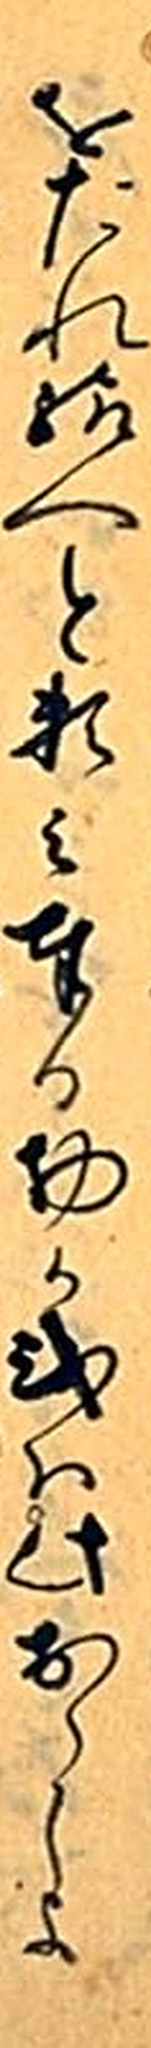をたれ給へと頼み奉る物か或は此おらしよ
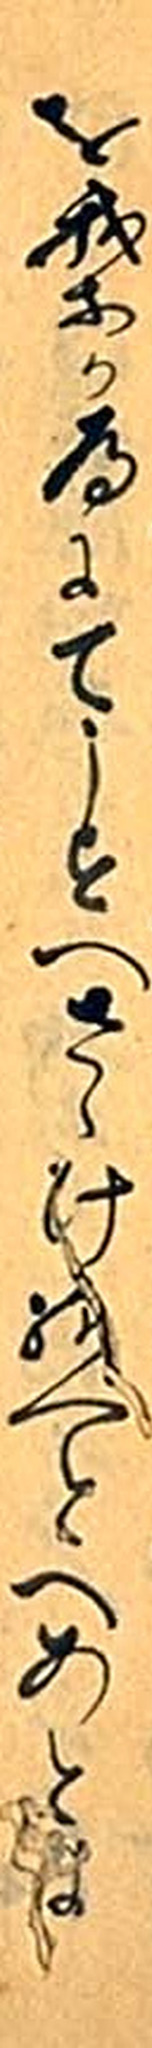を我等か為にてうすへさゝけ給へとへあとに
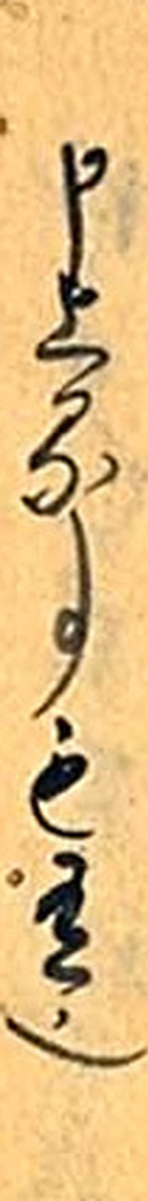申上る事も有也
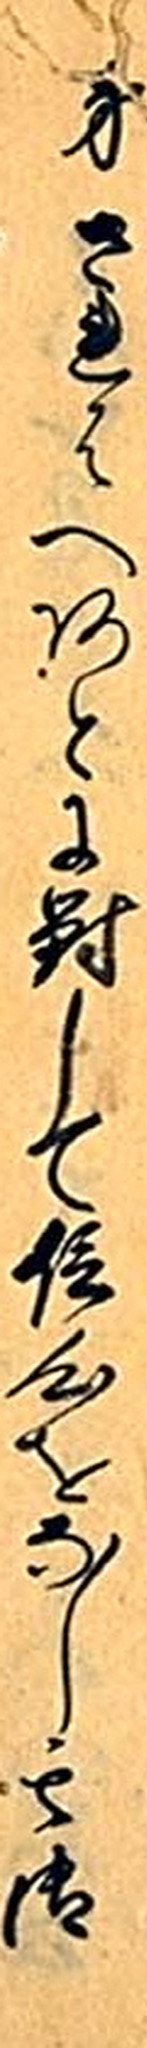弟されはへあとに対して信心をなし其御
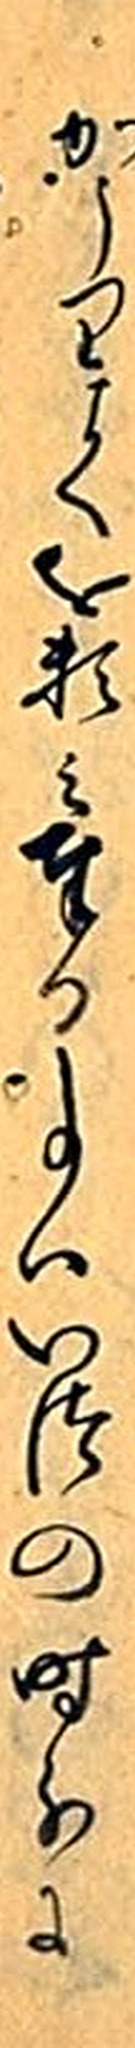かうりよくを頼み奉る事はいつの時分に
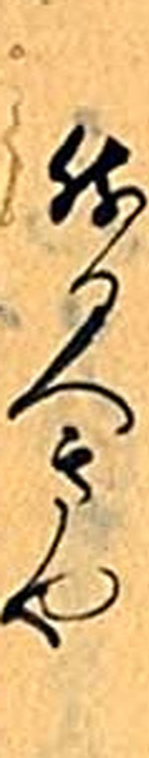然るへきや
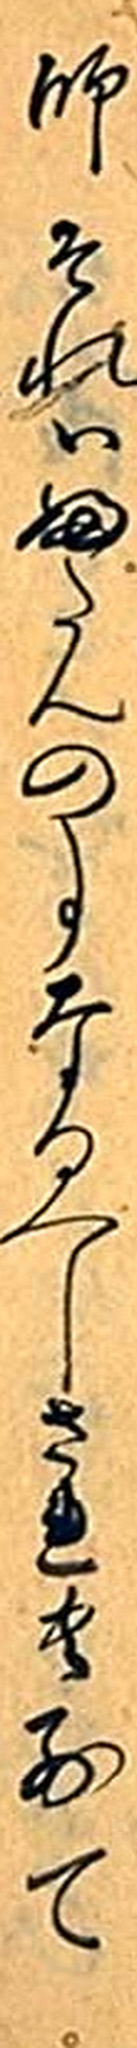師それはふたんの事なるへしされ貴別て
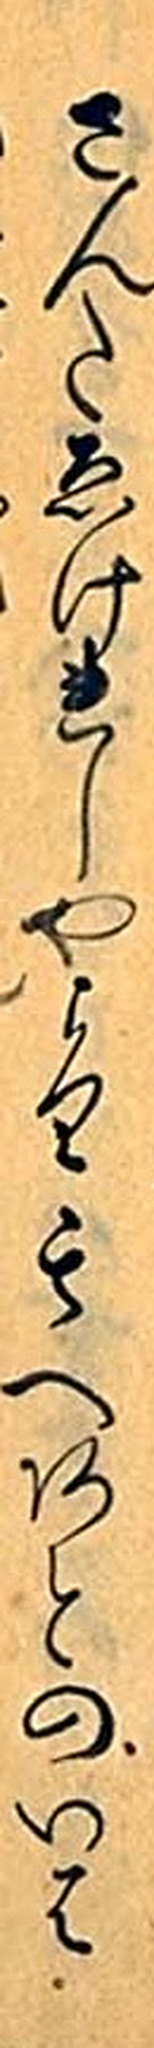さんたゑけれしやより其へあとのいは
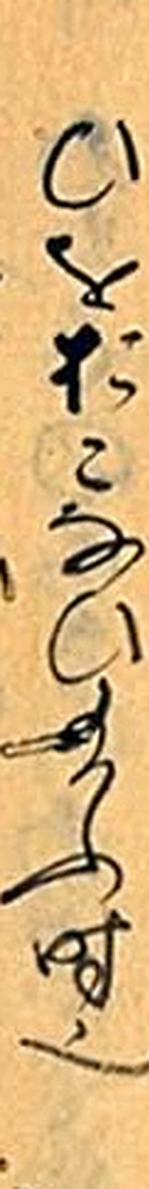ひをおこなひ給ふ時也
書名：ドチリナ・キリシタン
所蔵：東京大学総合図書館 / General Library in the University of Tokyo
